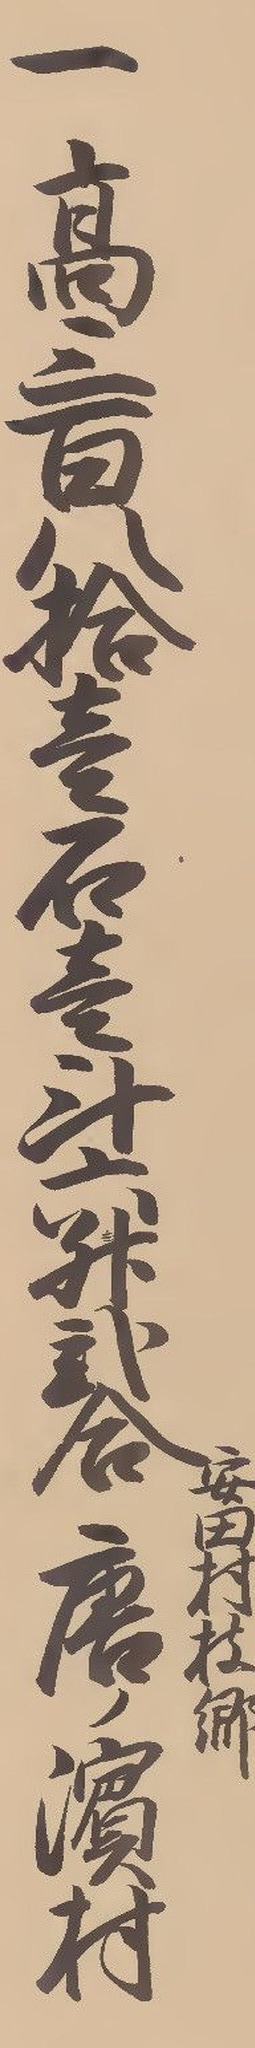一髙三百八拾壱石壱斗六升弐合唐ノ濱村
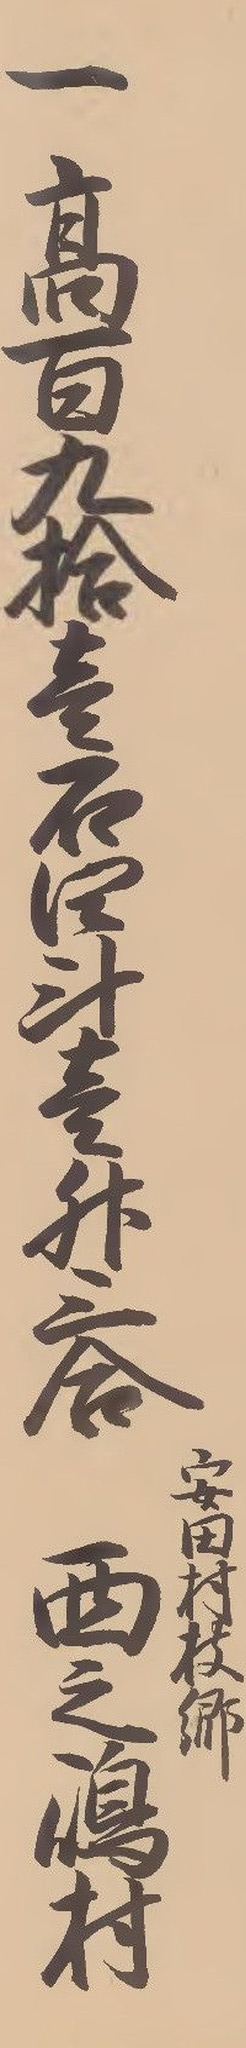一髙百九拾壱石四斗壱升三合西之嶋村
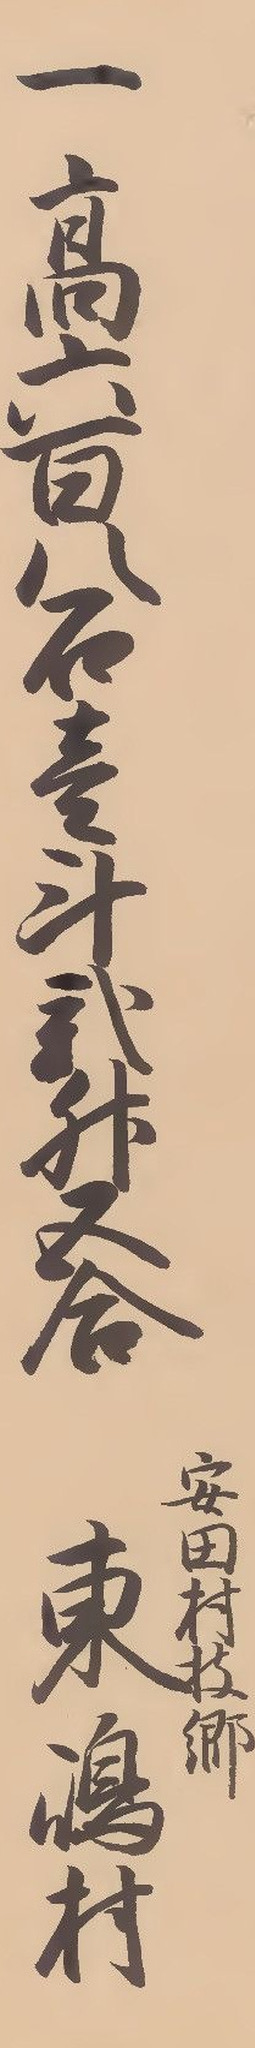一髙六百八石壱斗弐升五合東嶋村

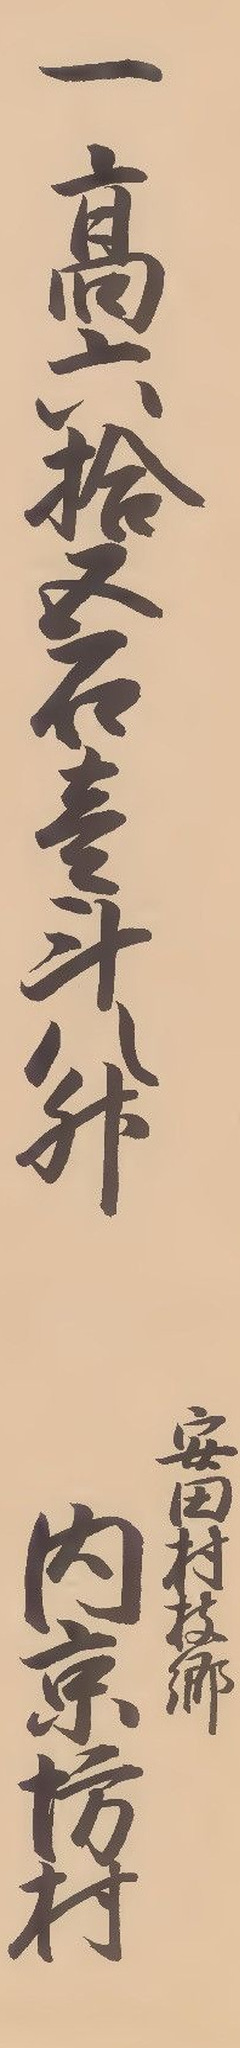一髙六拾五石壱斗八升内京坊村
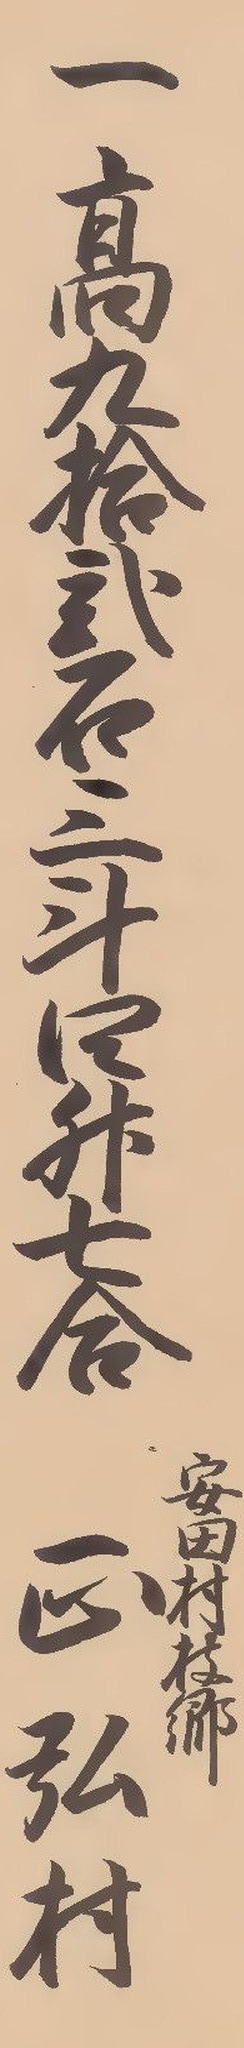一髙九拾弐石三斗四升七合正弘村
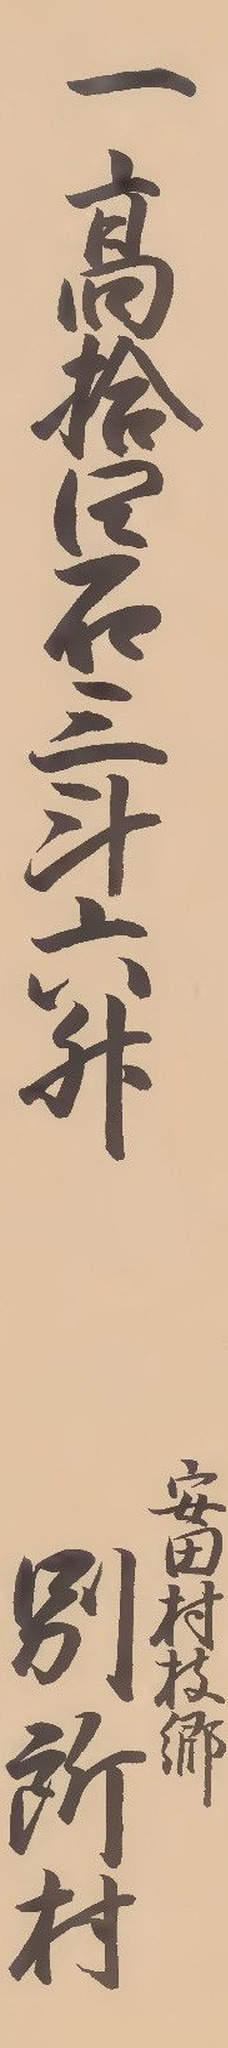一髙拾四石三斗六升別所村
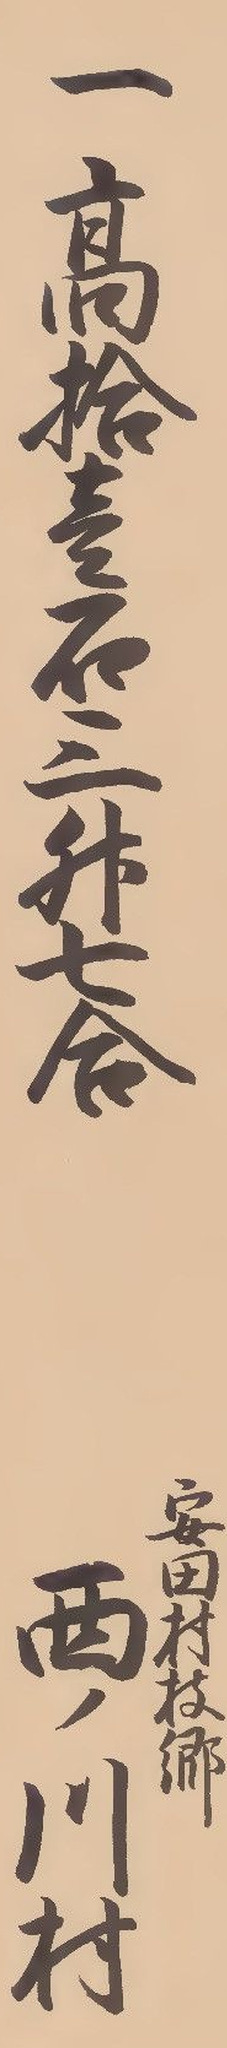一髙拾壱石三升七合西ノ川村
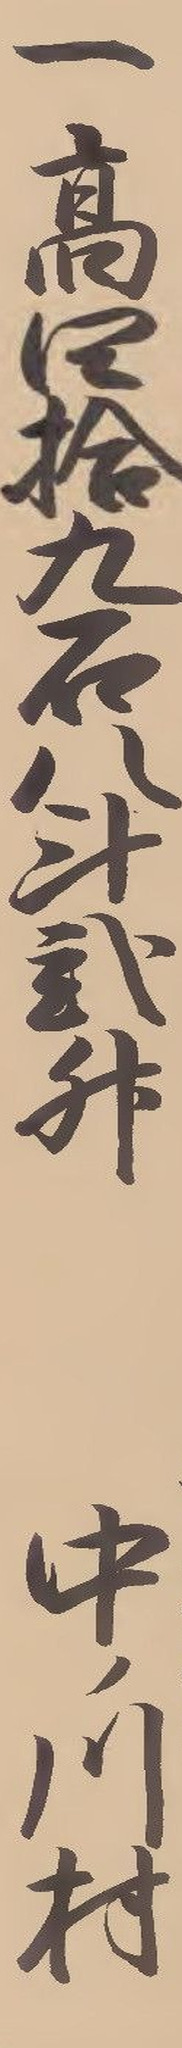一髙拾九石八斗弐升中ノ川村
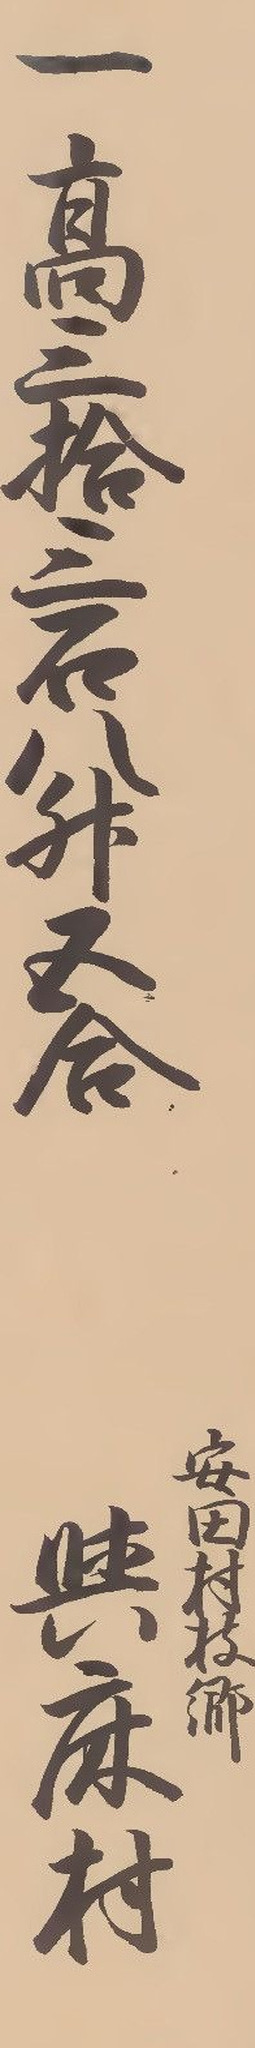一髙三拾三石八升五合與床村
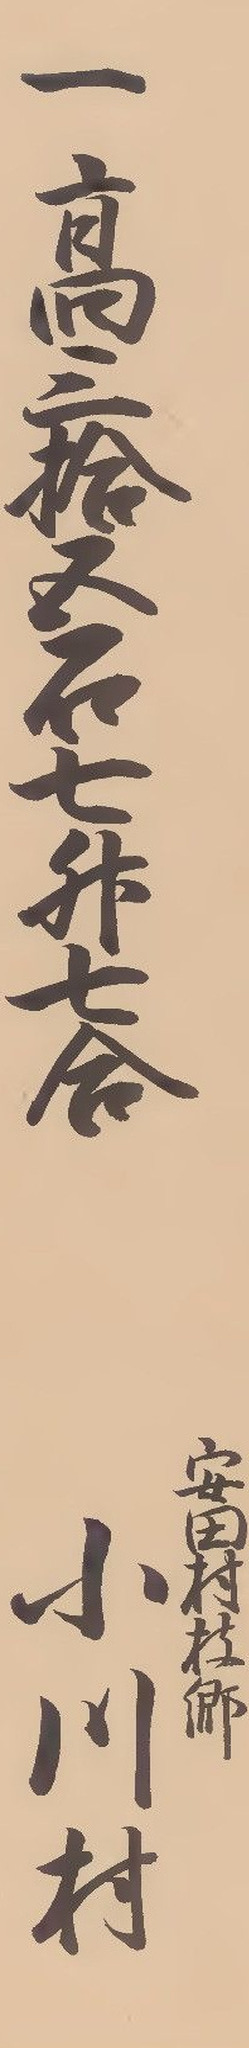一髙三拾五石七升七合小川村
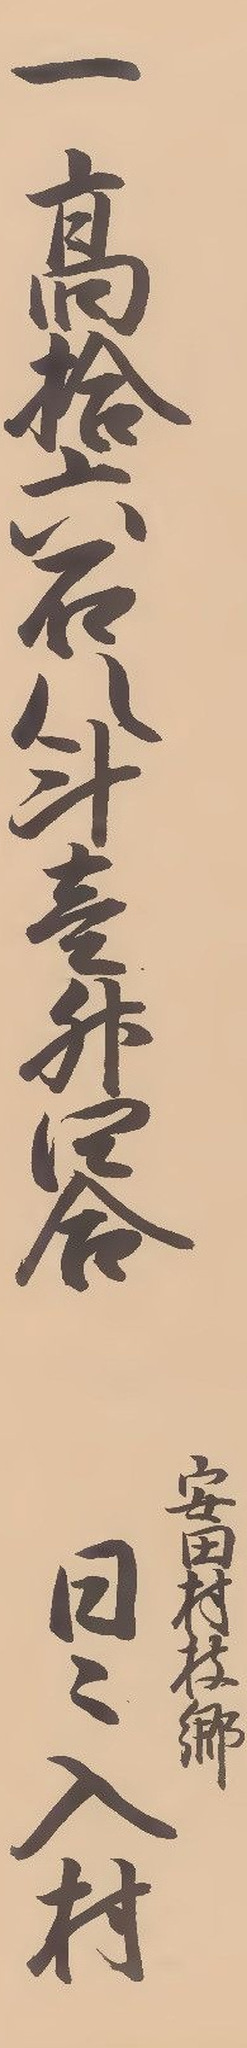一髙拾六石八斗壱升四合日々入村

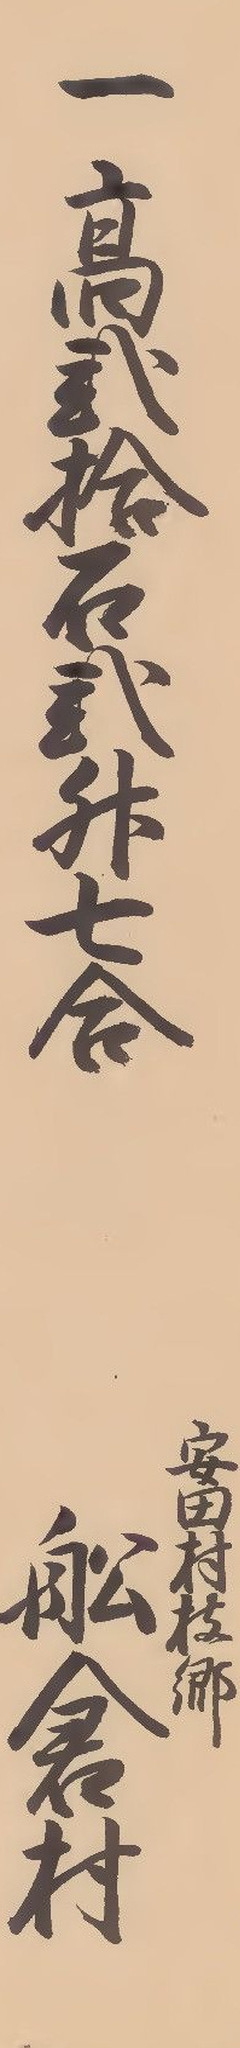一髙弐拾石弐升七合舩倉村
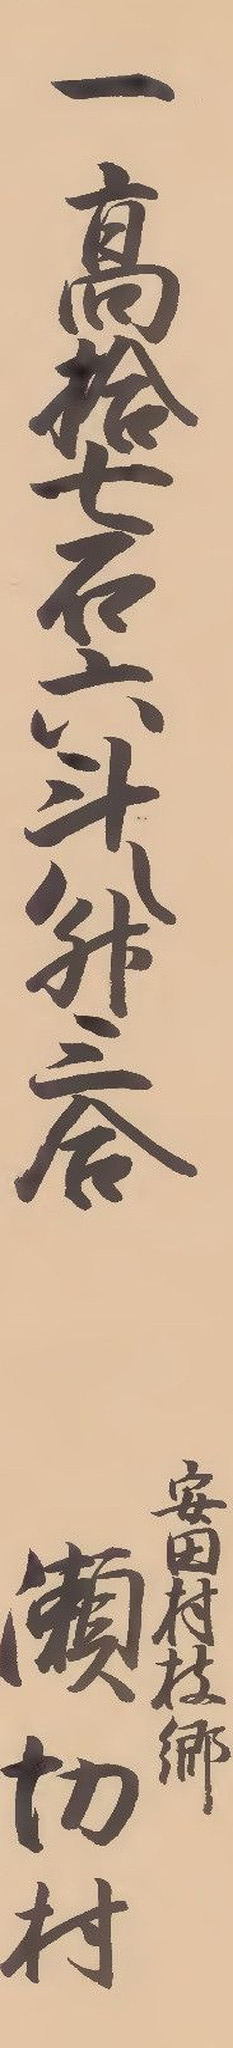一髙拾七石六斗八升三合瀬切村
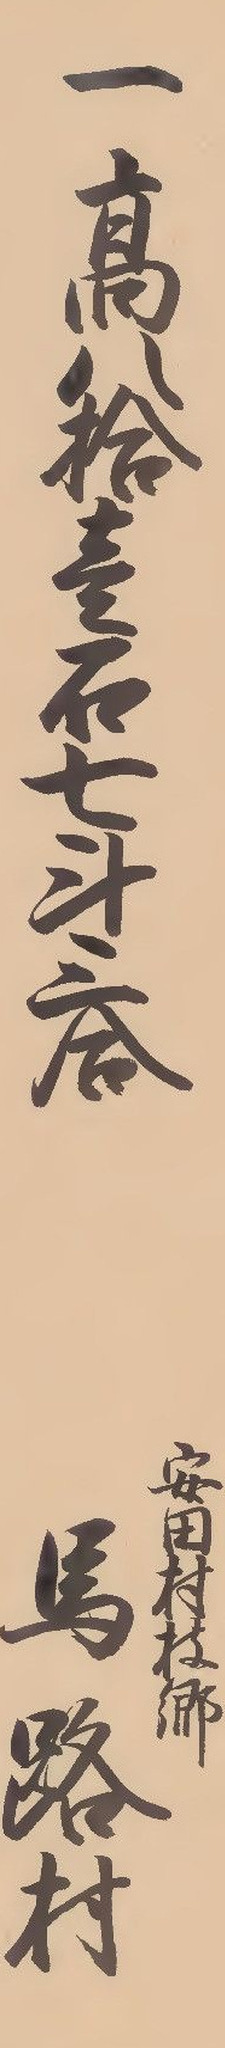一髙八拾壱石七斗三合馬路村
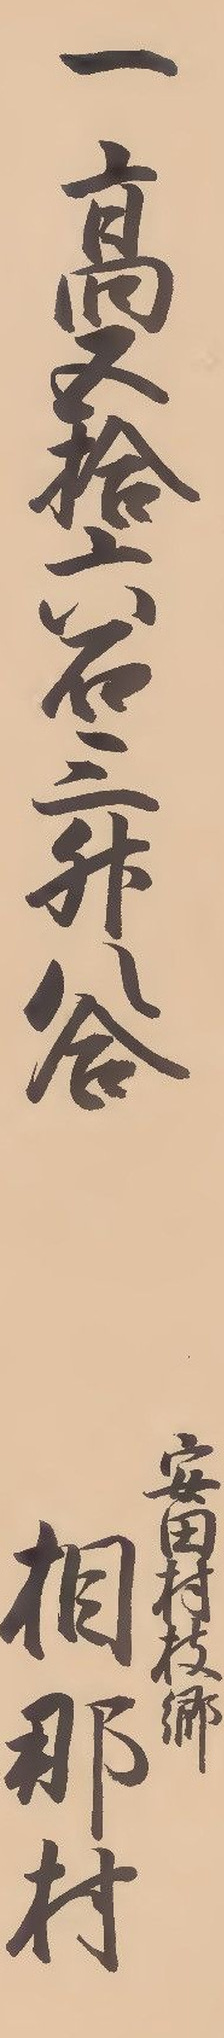一髙五拾六石三升八合相那村
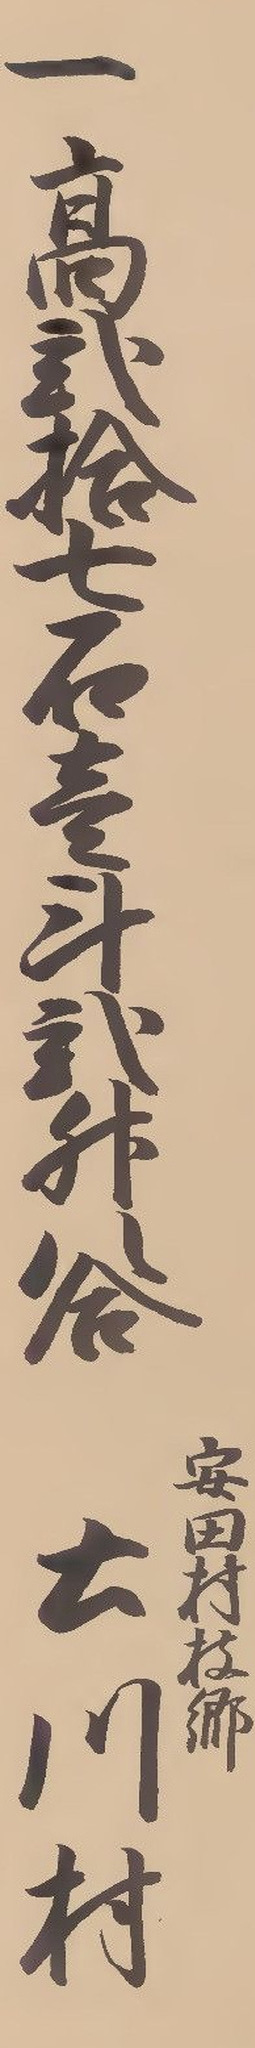一髙弐拾七石壱斗弐升八合土川村
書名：土佐国郷帳
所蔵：国立公文書館 National Archives of Japan
